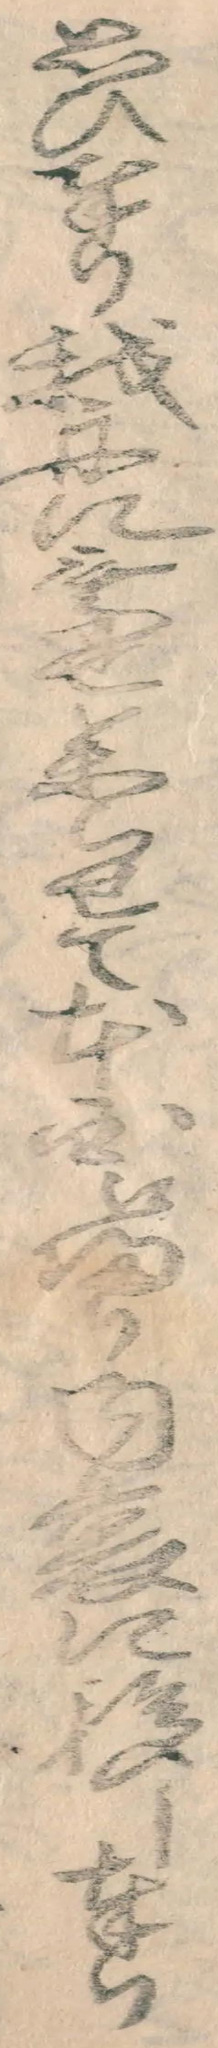思ひ奉り我舟に乗せ参らせて本国え帰り内裏に移し奉り

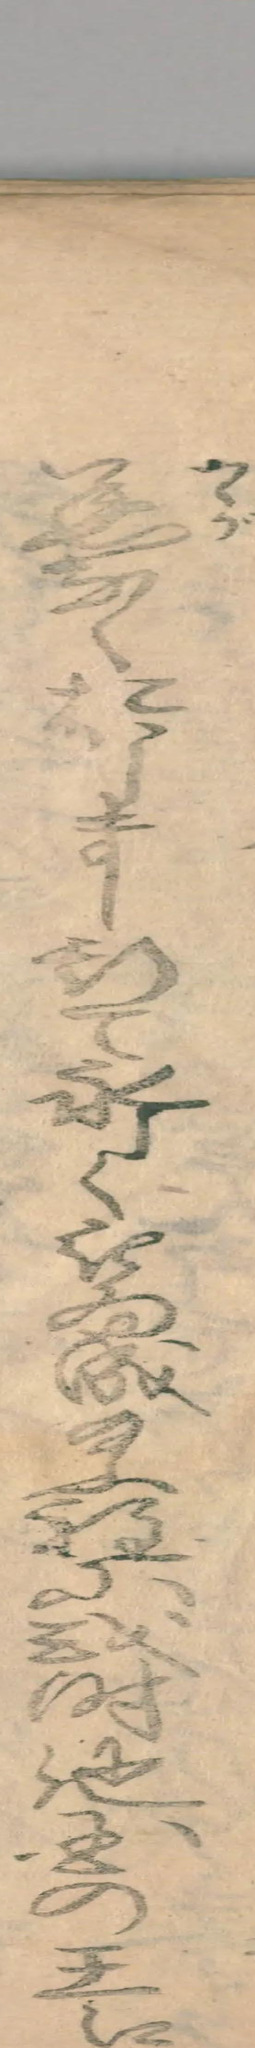恙なくおはしまし斯て永しく被為成給ふ程に或時国の王え
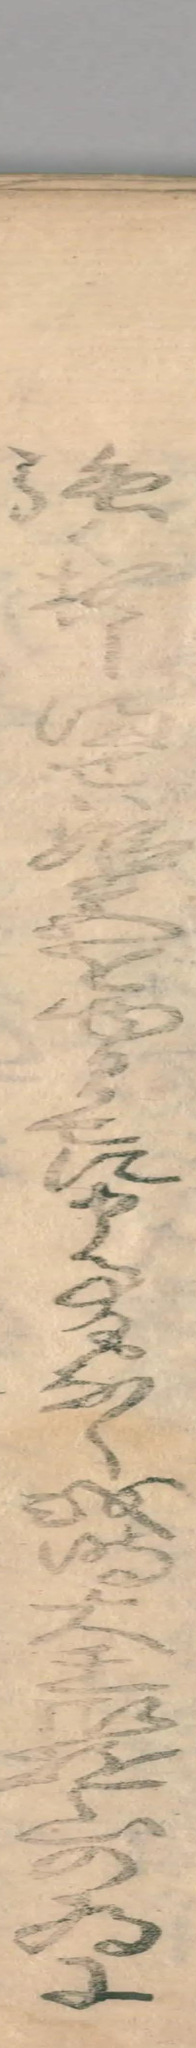強く遊しませは姫宮をゆるかせに申事もなく或時大王御遊山の為に
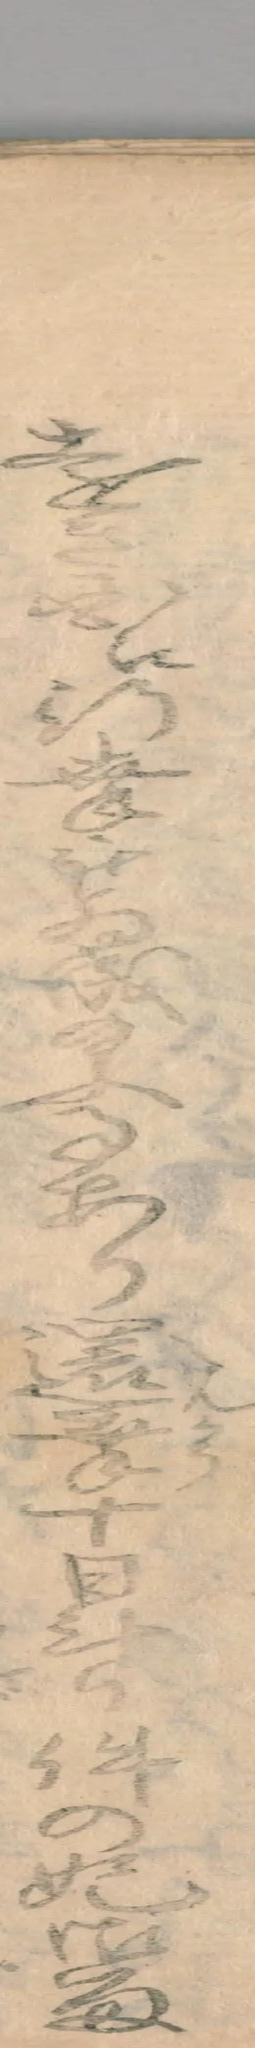遠き国え行幸被為成給ふ事あり還幸十日斗り件の妃御留
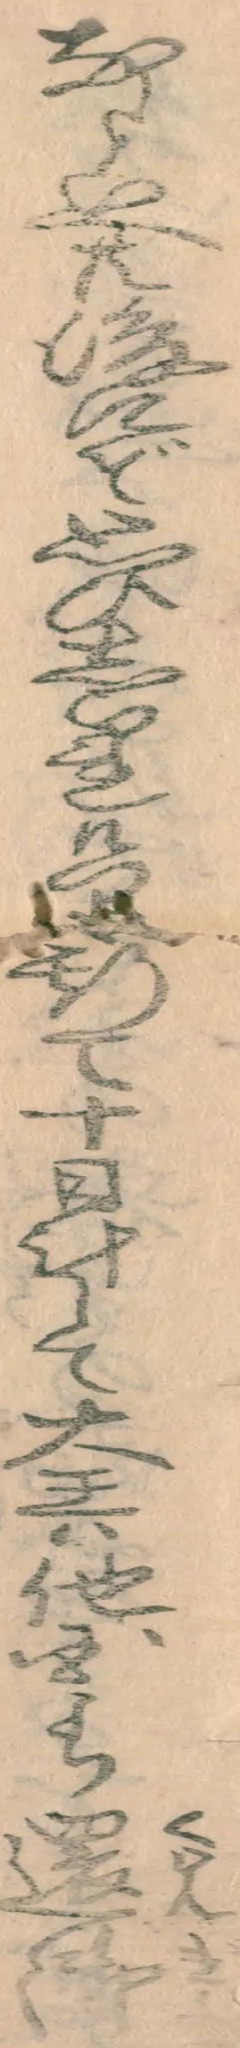なといへ共後にぞ思ひしられけり斯て十日斗して大王は他国より還御
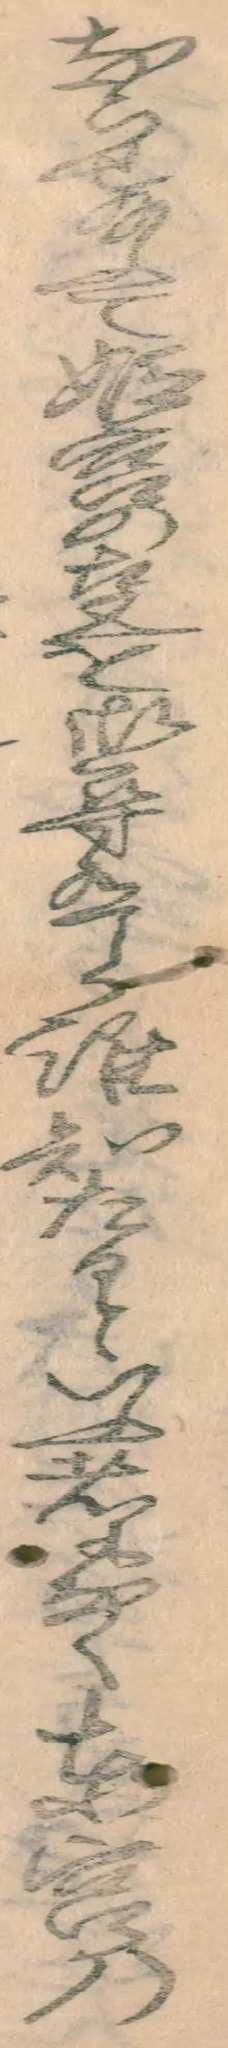ならせ給ふて姫宮の事を御尋有しか誰知たるといふ者もなく東宮の
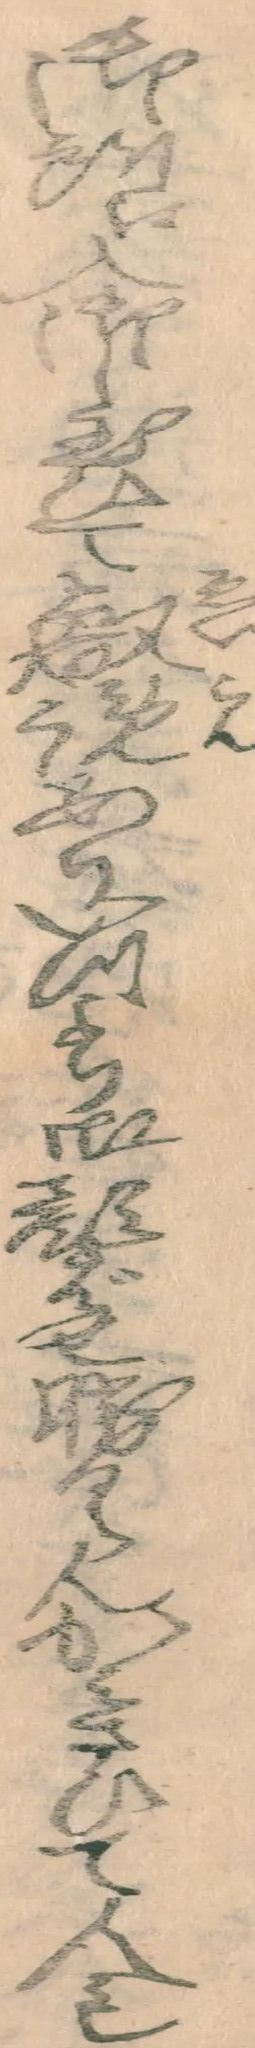御所え入御し玉ひて叡覧ありいつより御顔ばせ勝るらんかみ？きひて人も
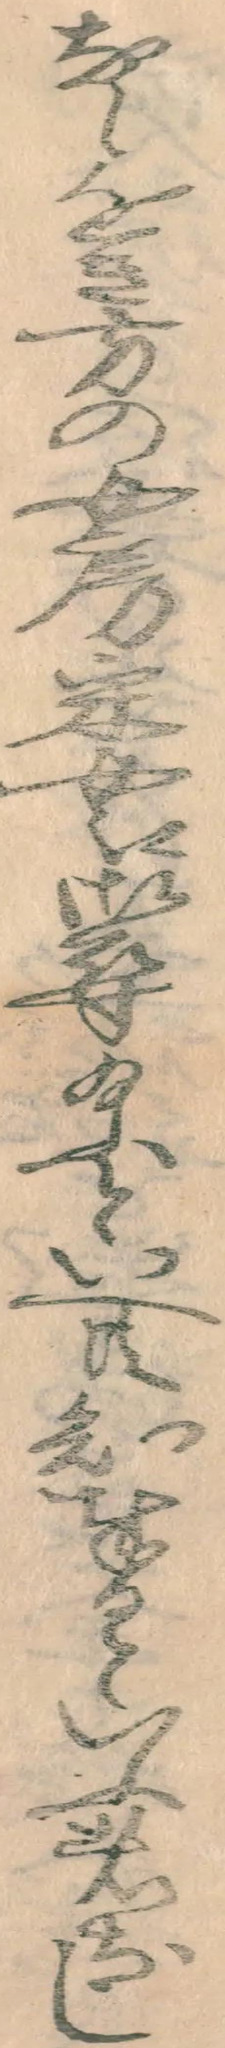なし近き方の女房采女え御尋ね給ふといへ共知奉るといふ者なし
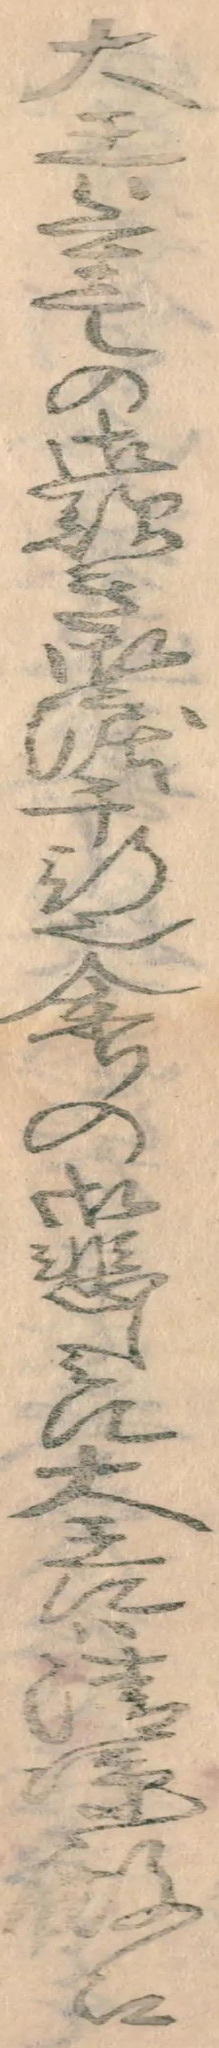大王御難き御涙千行也余りの御悲しみに大王には清涼殿え
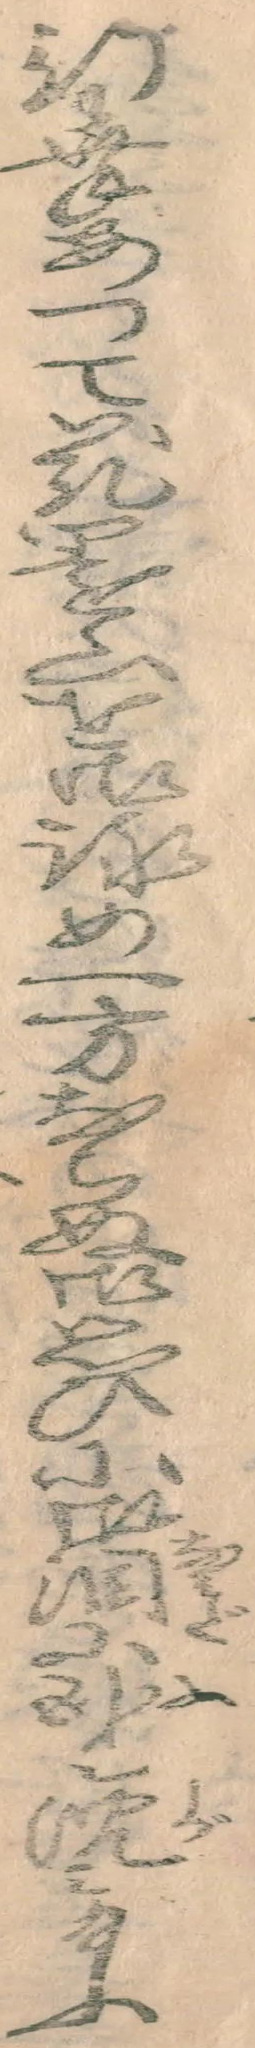行幸あつて花置山を御眺め一方ならぬ御思ひに御泪に臥し沈み給ふ
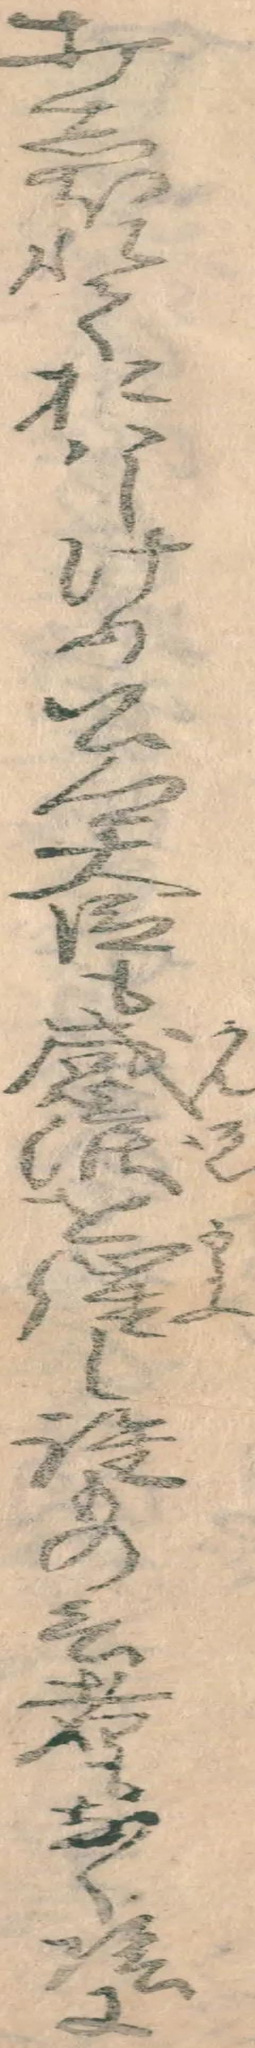打しほれておはしけり公卿大臣も感涙を催し誰もの云者もなく陰に
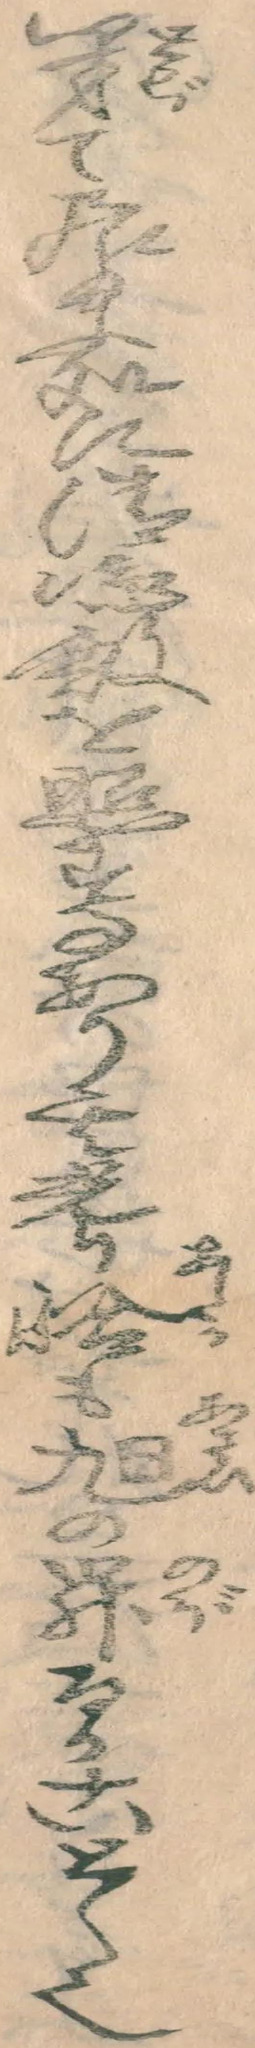閉て居給ふ処に清涼殿を照す事あり其光り恰も旭の昇るかことく也
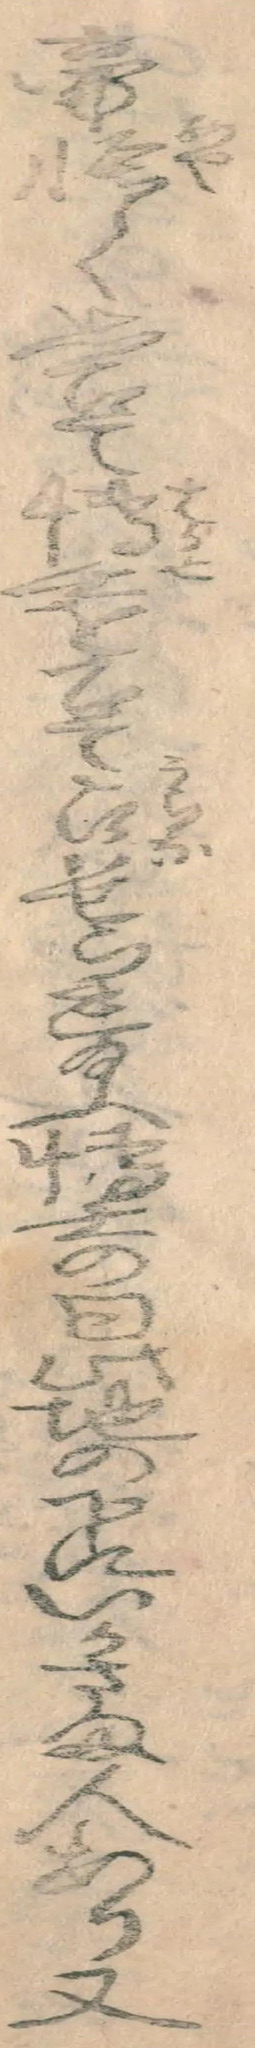帝怪しく思召て博士を召て占はせられ給ふ博士の曰此地の下にいかさま人あり又
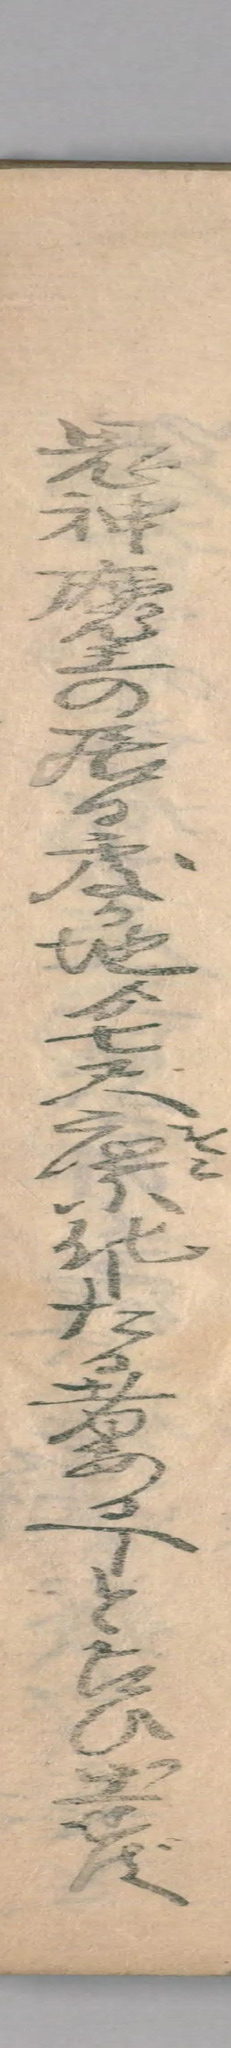鬼神魔王の居る処か地ゟ七尺底に化したる者あるへしと占ひ居出せば
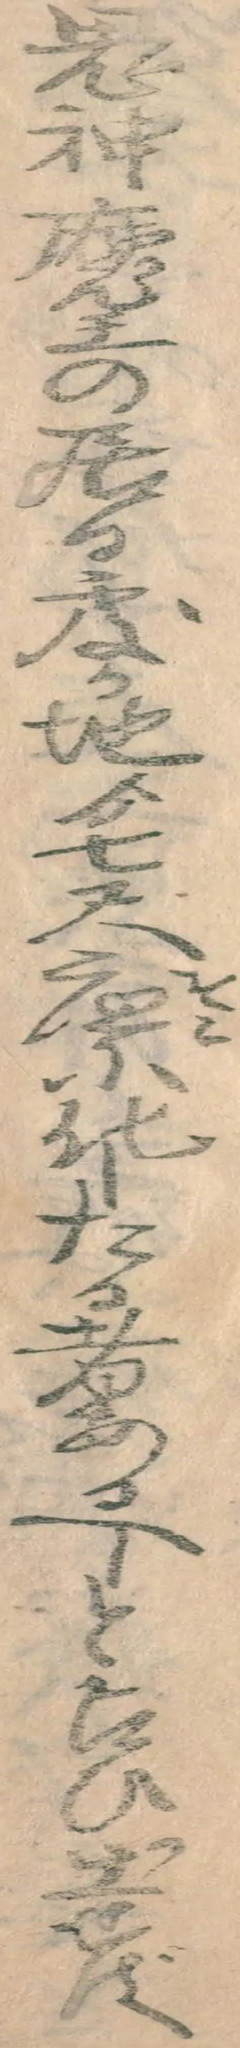鬼神魔王の居る処か地ゟ七尺底に化したる者あるへしと占ひ居出せば
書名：蚕養御由来記
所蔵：国立国会図書館 National Diet Library, JAPAN
